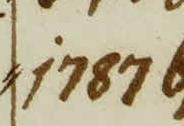1787
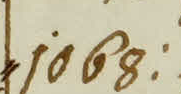1068
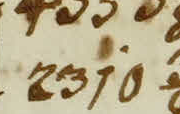2310
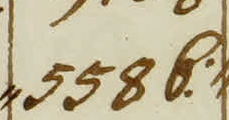5586.
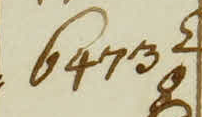6473
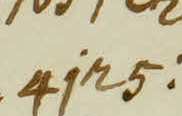4125
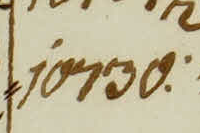10730.
